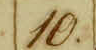10.
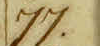77.
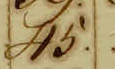45.
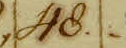48.
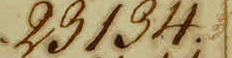23134.
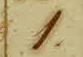1.
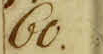60.
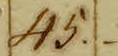45.
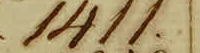1411.
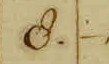8.
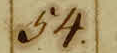54.
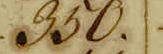350.
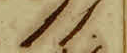11.
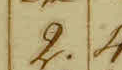2.
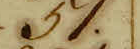51.
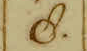8.
